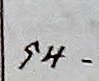54
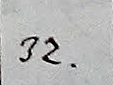32.
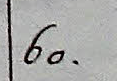60.
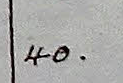40.
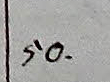50.
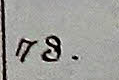78.
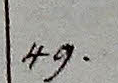49.
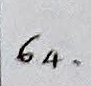64
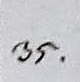35
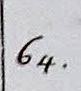64
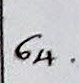64
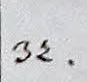32
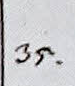35
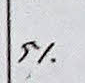51
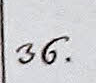36.
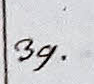39.
